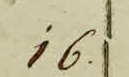16.
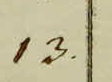13.
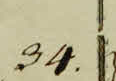34.
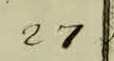27
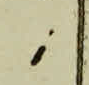1
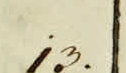13.
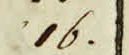16.
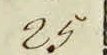25
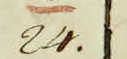24.
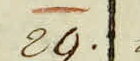29.
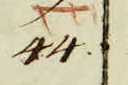44.
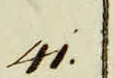41.
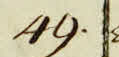49.
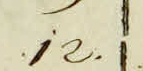12.
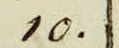10.
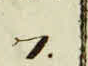7.
